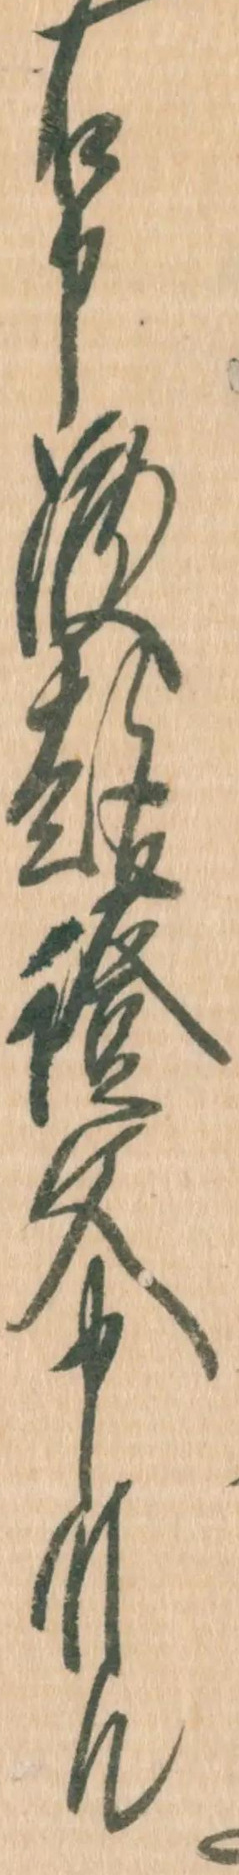右申渡趣証文申付ル
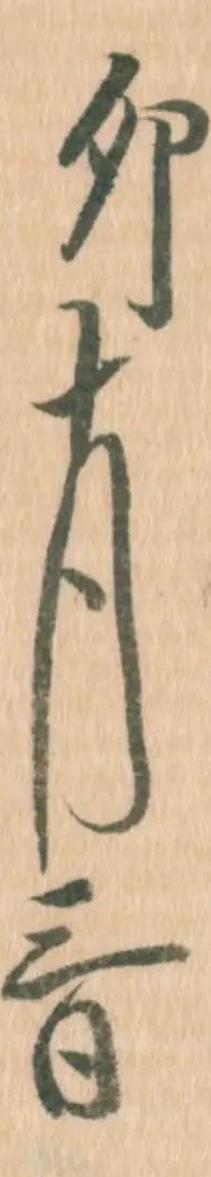卯十月三日
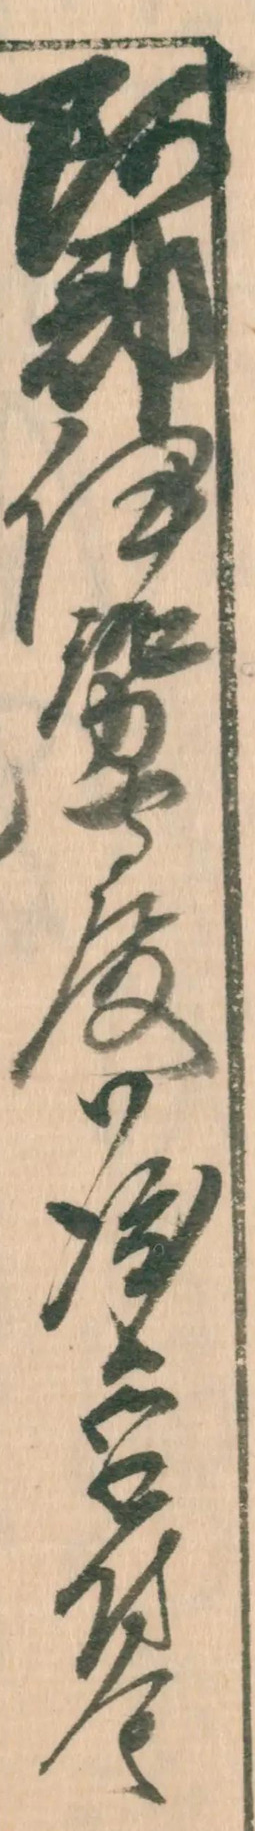│阿部伊㔟守殿御渡候御書付写
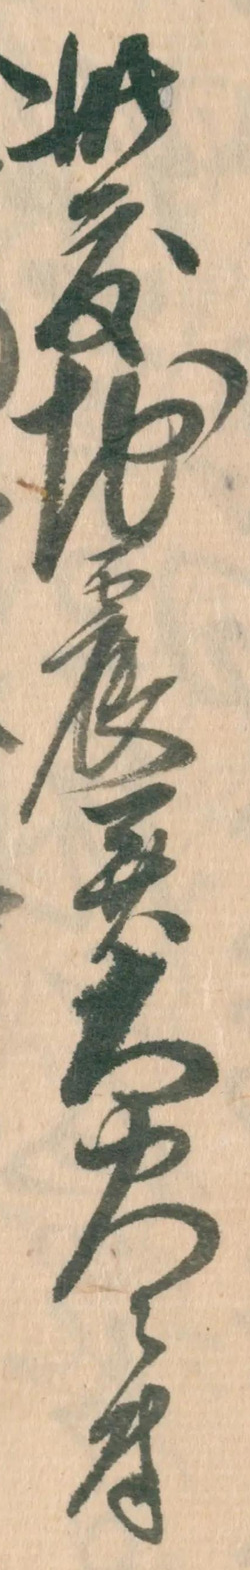此度地震幷大火ニ付
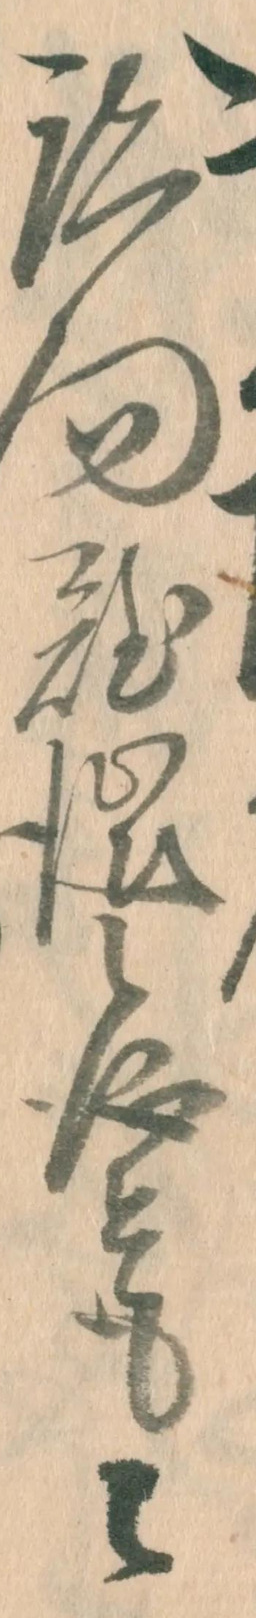諸向難渋之儀とも被
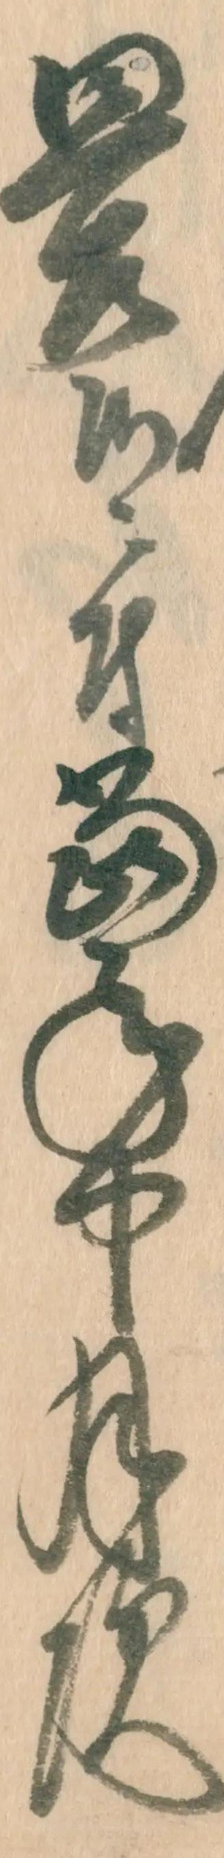思召候ニ付当年中月次

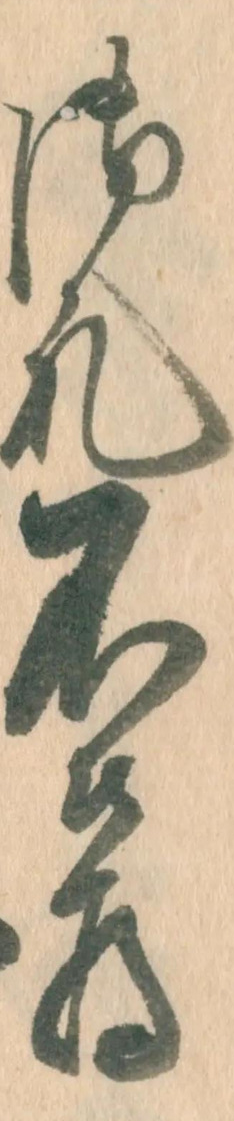御礼不被存
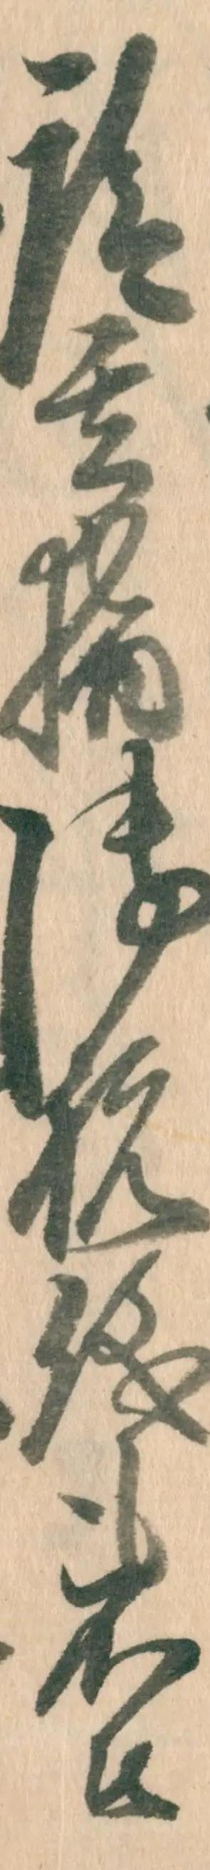請其指出申祝儀も不被
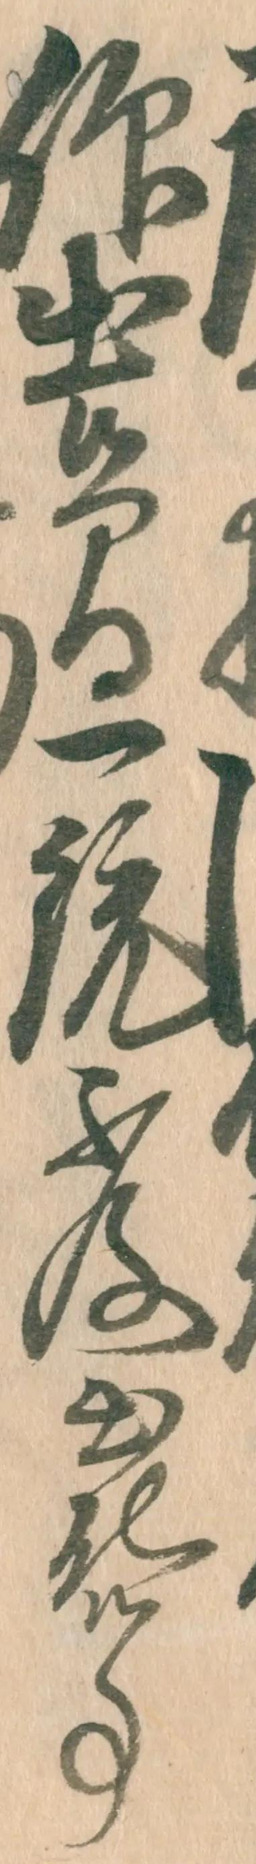仰出候間一統不及出仕候事
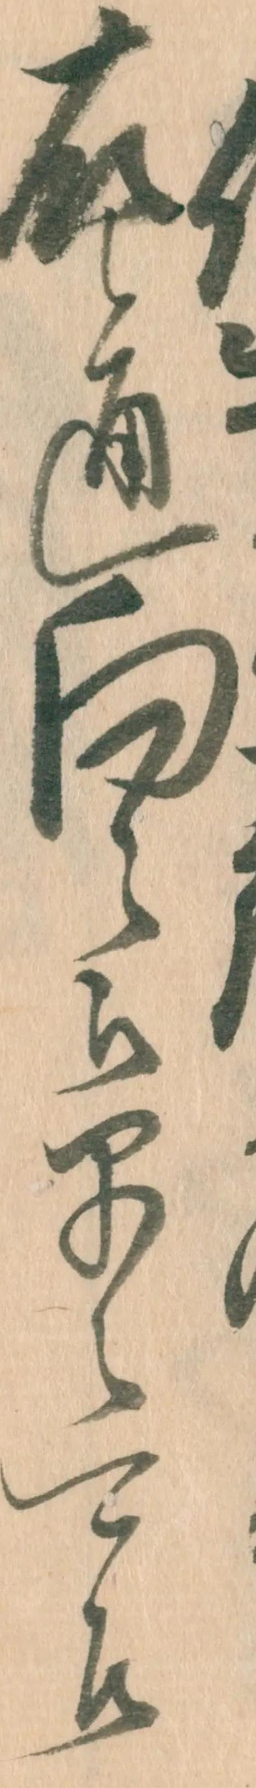右之通向〻江早〻可被
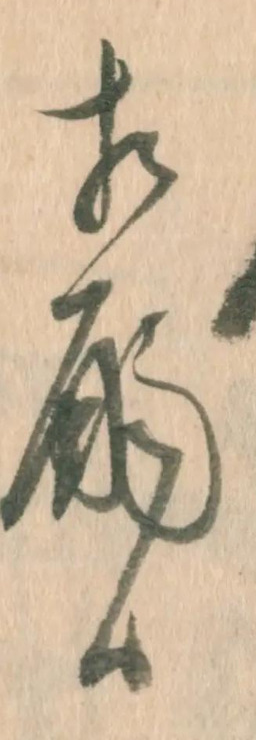相触候
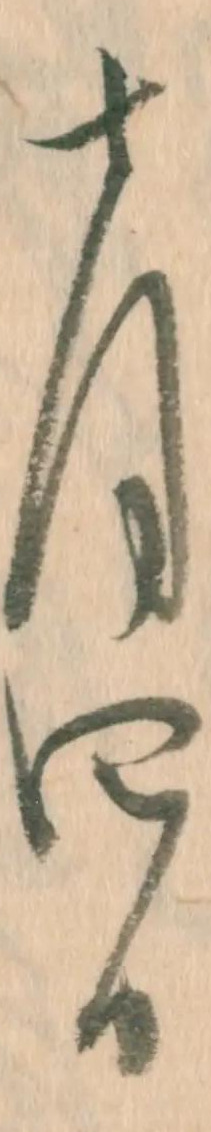十月四日
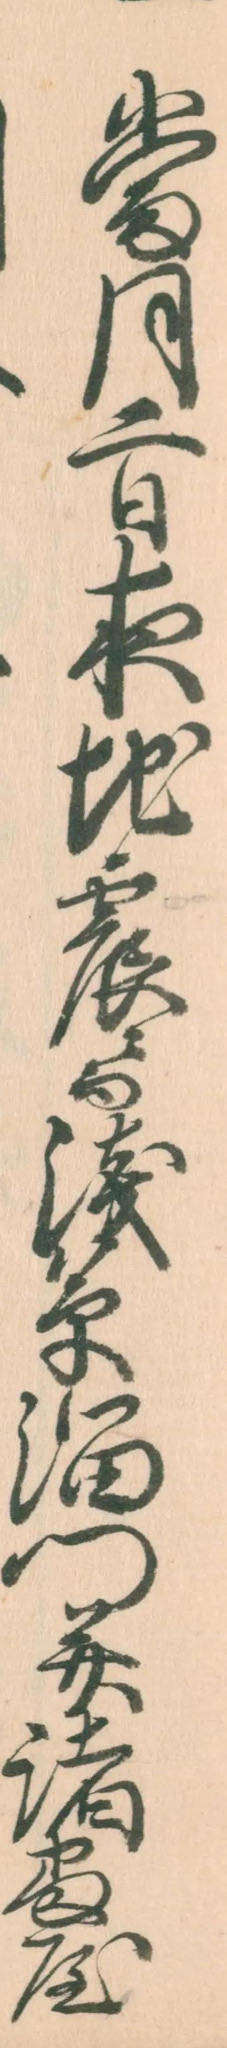一当月二日夜地震ニて浅草溜門幷諸番屋
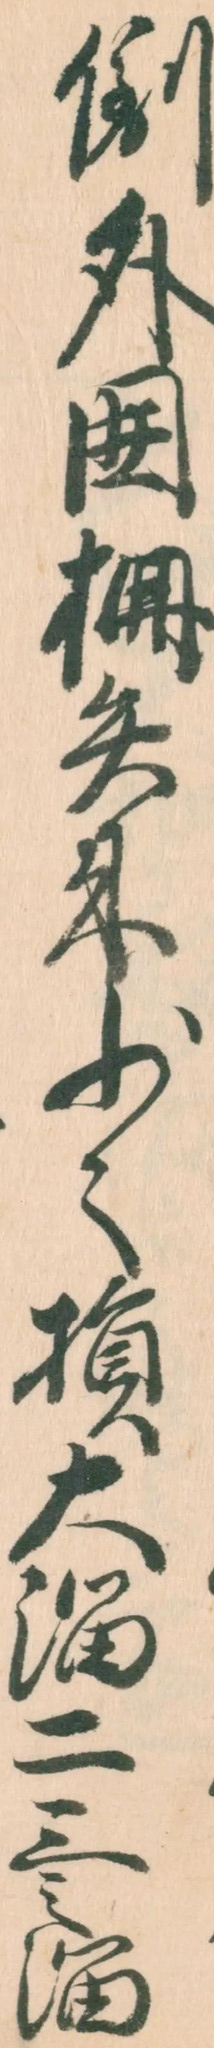倒外囲柵矢来少〻損大溜二三之溜
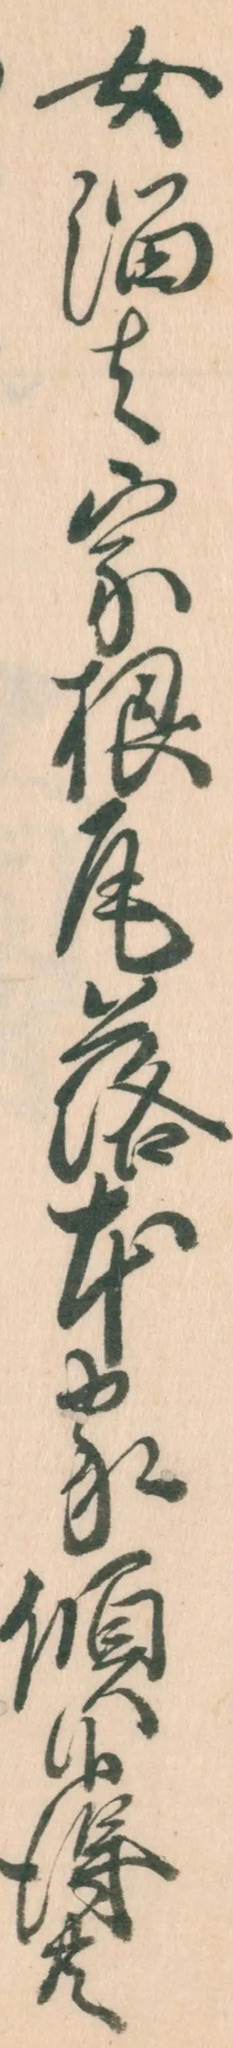女溜は家根瓦落本家傾候得共
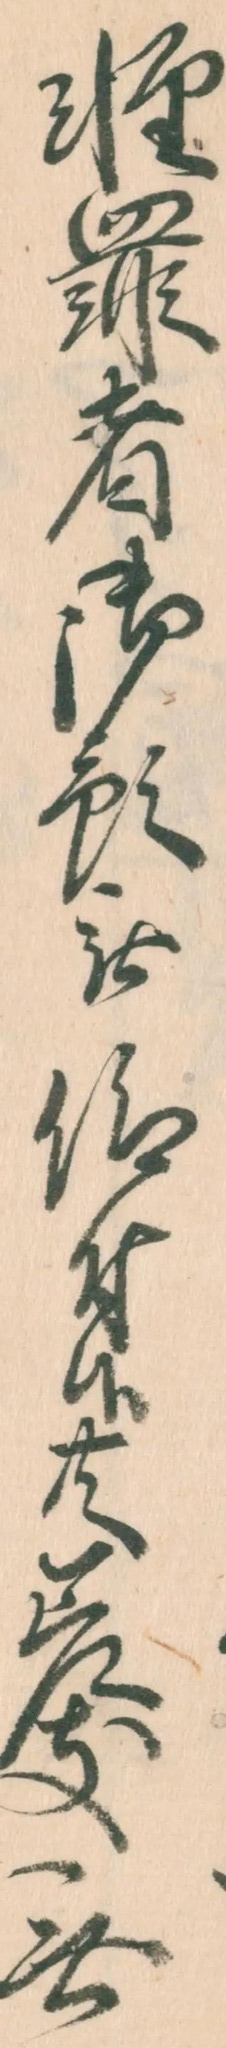軽罪者御預被仰付候共差支無
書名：地震災書留 2巻. [2] 内表紙に「地震一件　安政二卯年十月」とあり
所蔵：国立国会図書館 National Diet Library, JAPAN
